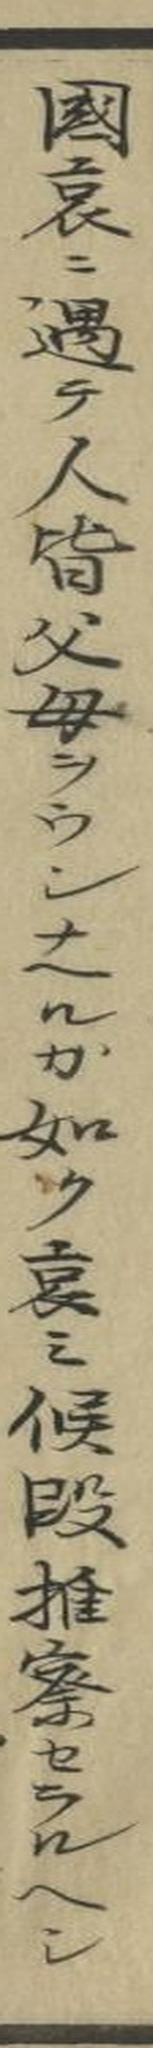国哀ニ遇テ人皆父母ヲウシナヘルカ如ク哀ミ候段推察セラルヘシ
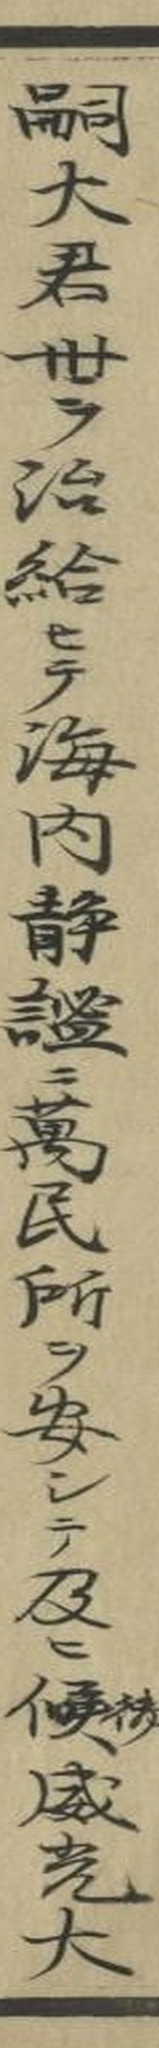嗣大君世ヲ治給ヒテ海内静謐ニ万民所ヲ安シテ及ヒ威光大
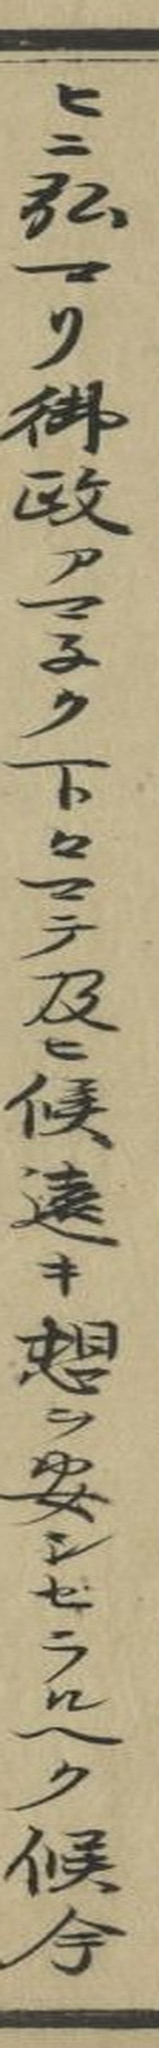ヒニ弘マリ御政あマネク下々マテ及ヒ候遠キ想ヲ安ンセラルヘク候
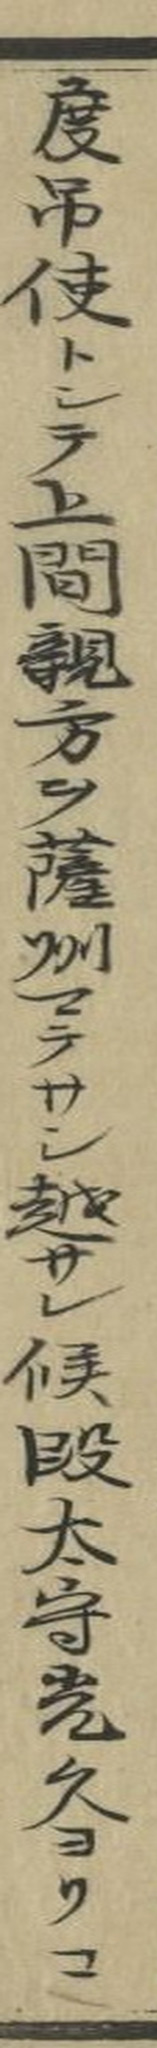度弔使トシテ上間親方ヲ薩州マテサシ越サレ候段太守充久ヨリコ
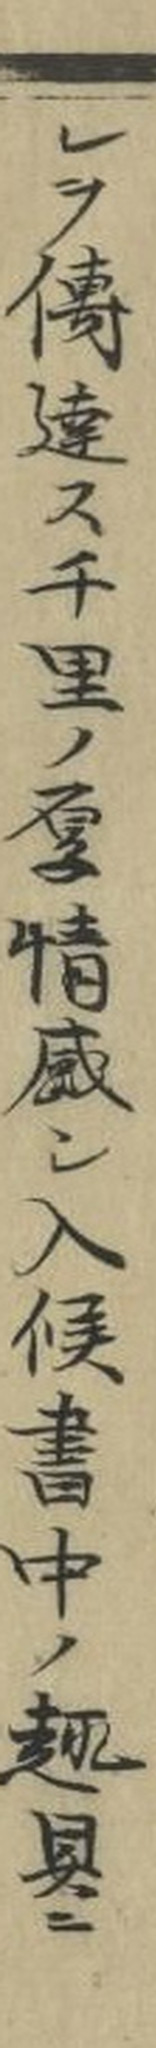レヲ伝達ス千里之厚情感シ入候書中ノ趣具ニ
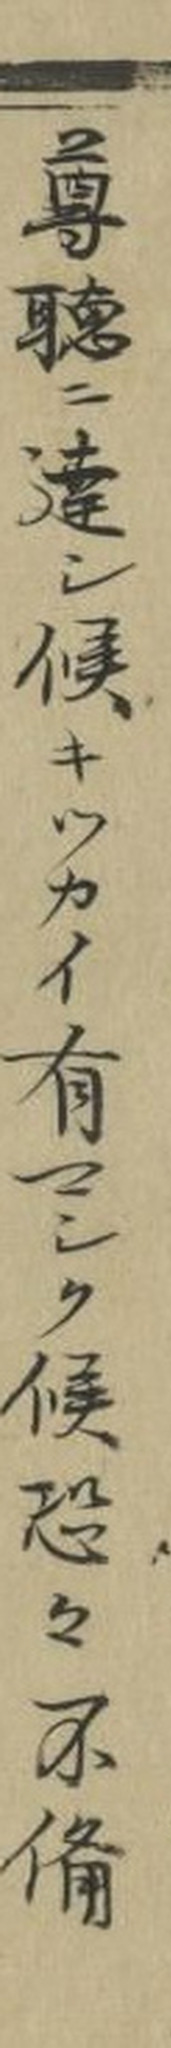尊聴ニ達シ候キツカイ有マシクそう恐々不備
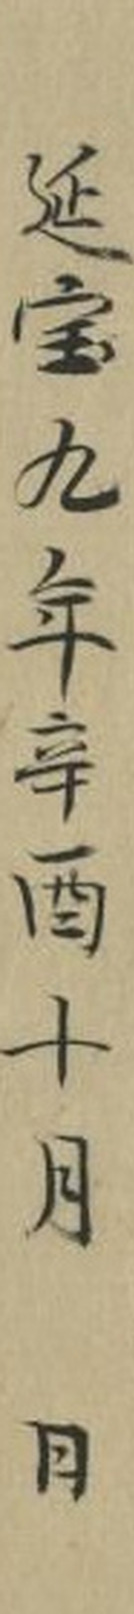延宝九年辛酉十月日
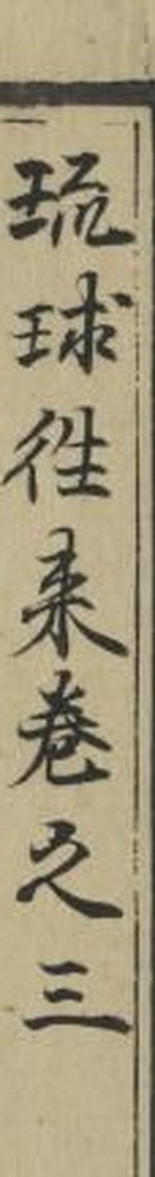琉球往来巻之三
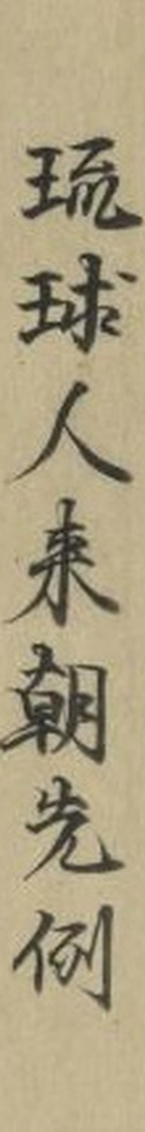琉球人来朝先例
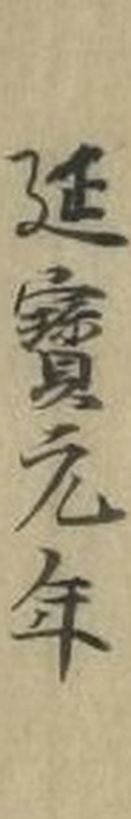延宝元年
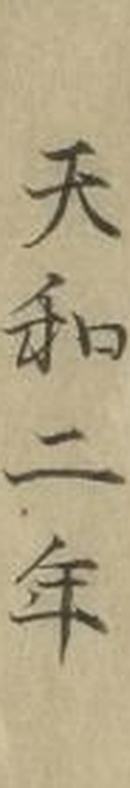天和二年

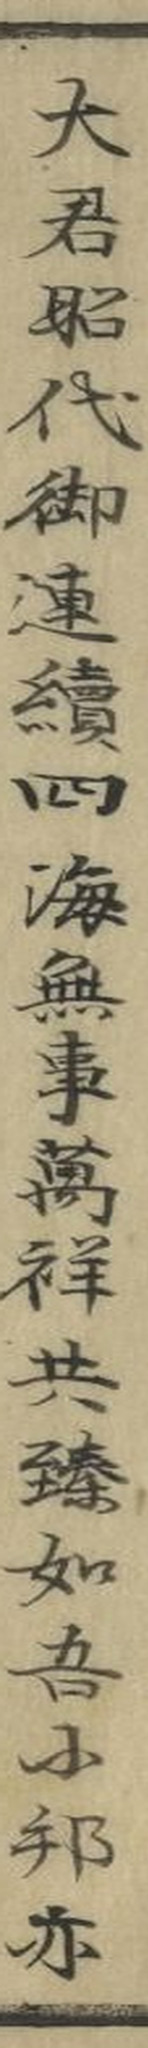大君昭代御連続四海無事万祥共臻如吾小邦亦
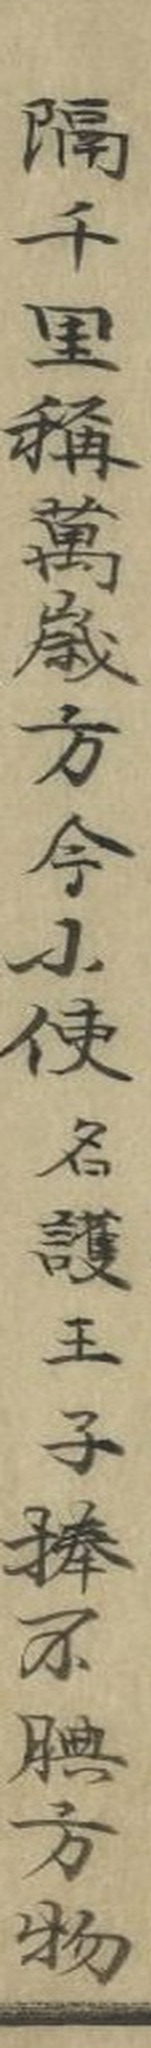隔千里称万歳方今小使名護王子捧不腆方物
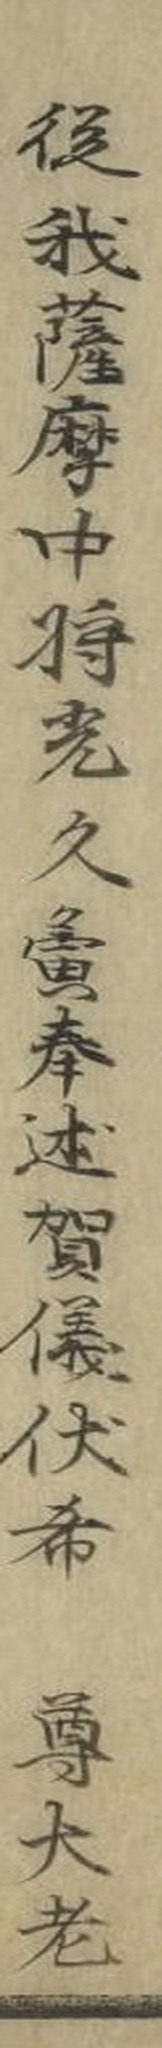従我薩摩少将光久々寅奉述賀儀伏尊大老
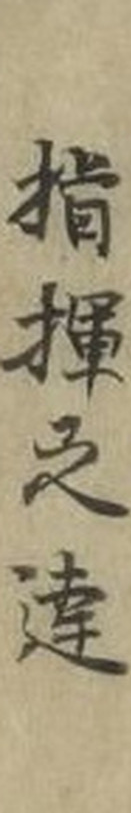指揮之達
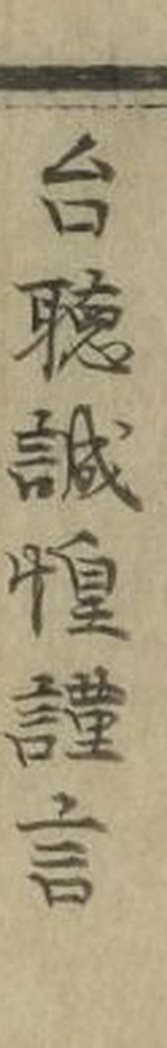台聴誠惶謹言
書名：琉球往来（下）
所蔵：University of the Ryukyus Library
